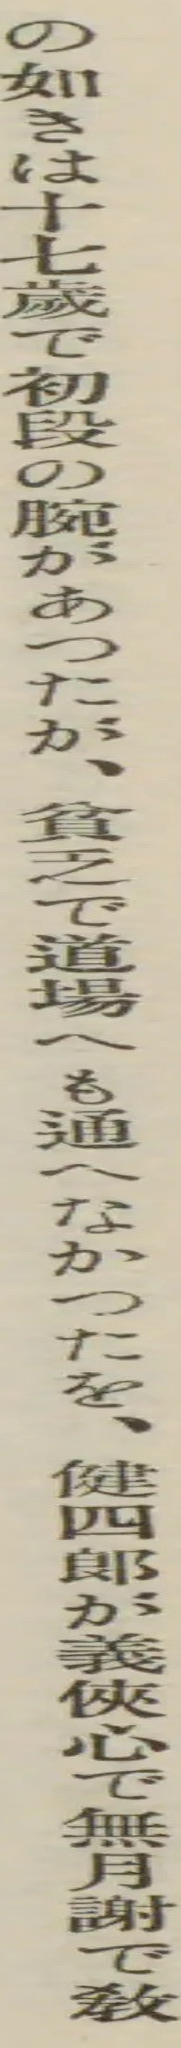の如きは十七歳で初段の腕があつたが、貧乏で道場へも通へなかつたを、健四郎が義侠心で無月謝で教
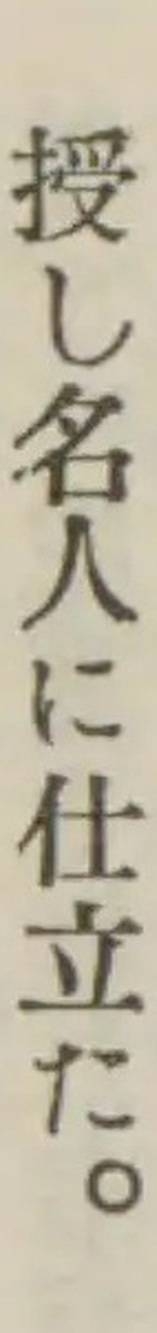授し名人に仕立た。
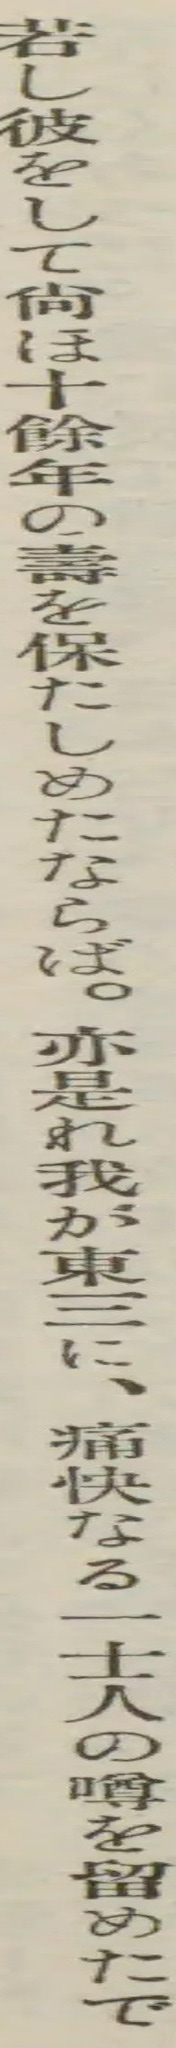若し彼をして尚ほ十余年の寿を保たしめたならば。亦是れ我が東三に、痛快なる一士人の噂を留めたで
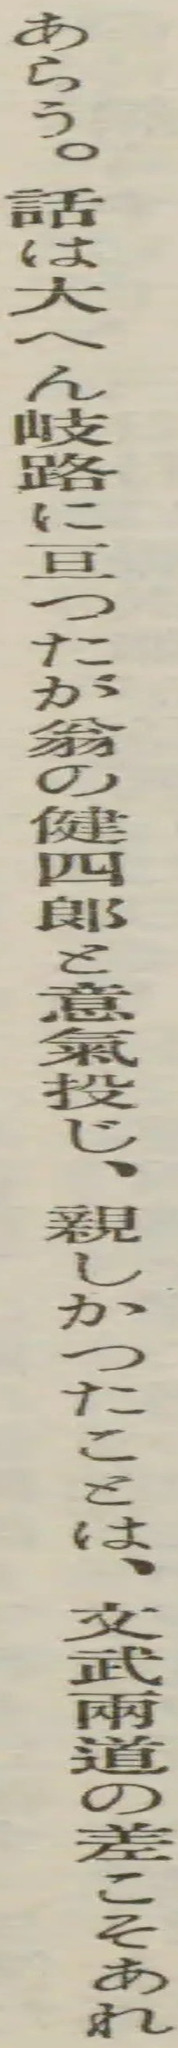あらう。話は大へん岐路に亘つたが翁の健四郎と意気投じ、親しかつたことは、文武両道の差こそあれ
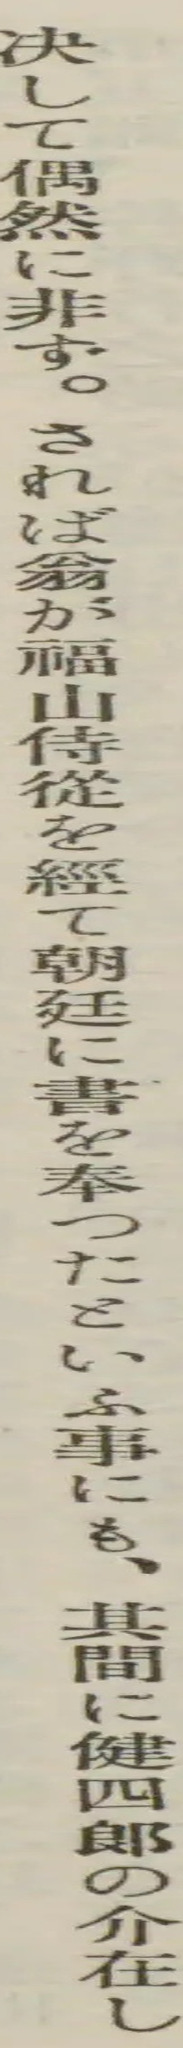決して偶然に非ず。されば翁が福山侍従を経て朝廷に書を奉つたといふ事にも、其間に健四郎の介在し
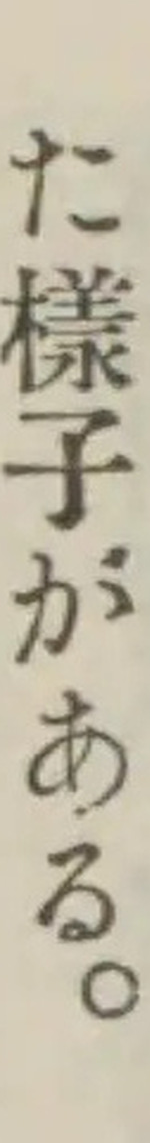た様子がある。
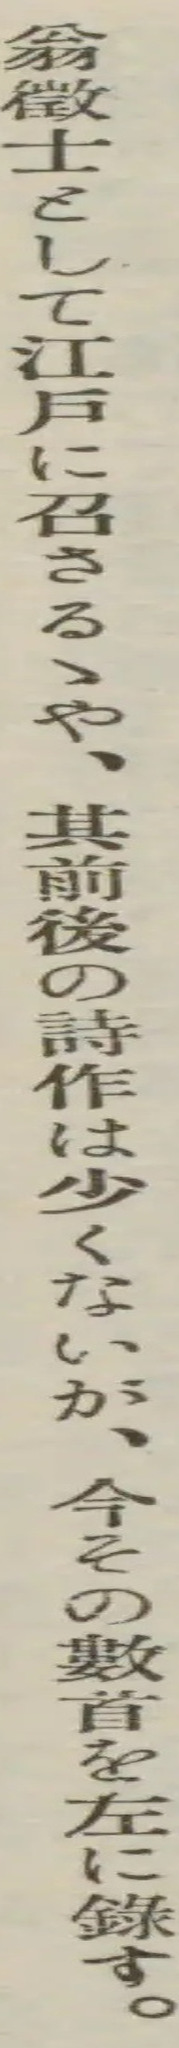翁徴士として江戸に召さるゝや、其前後の詩作は少くないが、今その数首を左に録す。
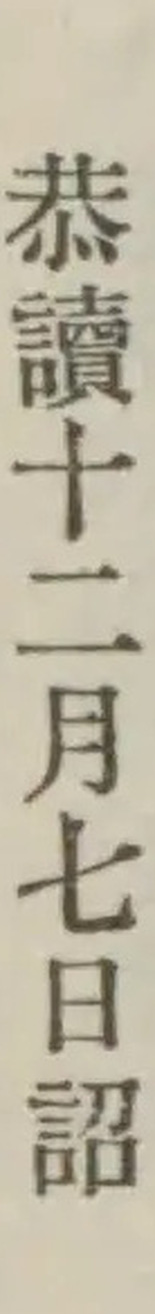恭讀十二月七日詔
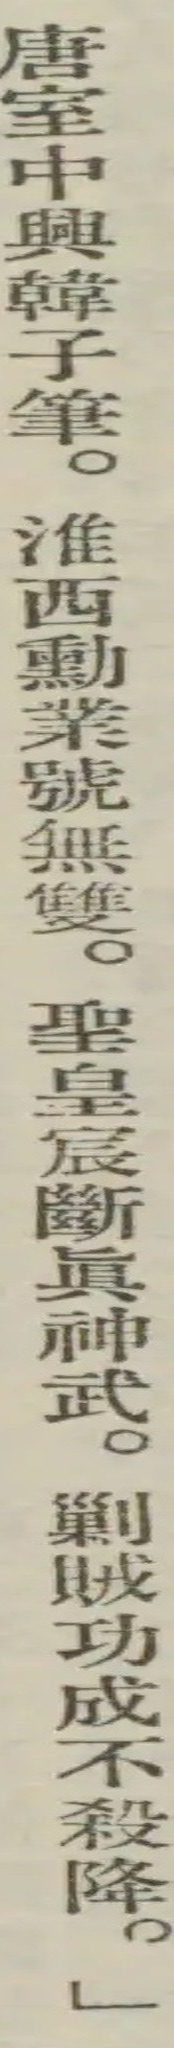唐室中興韓子筆。淮西勲業號無雙。聖皇宸斷眞神武。剿賊功成不殺降。」
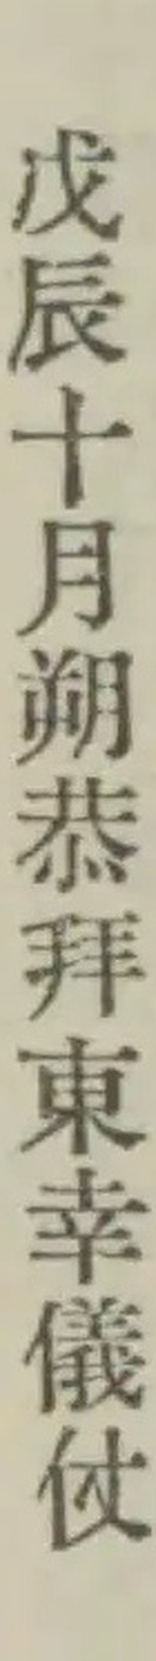戊辰十月朔恭拝東幸儀仗
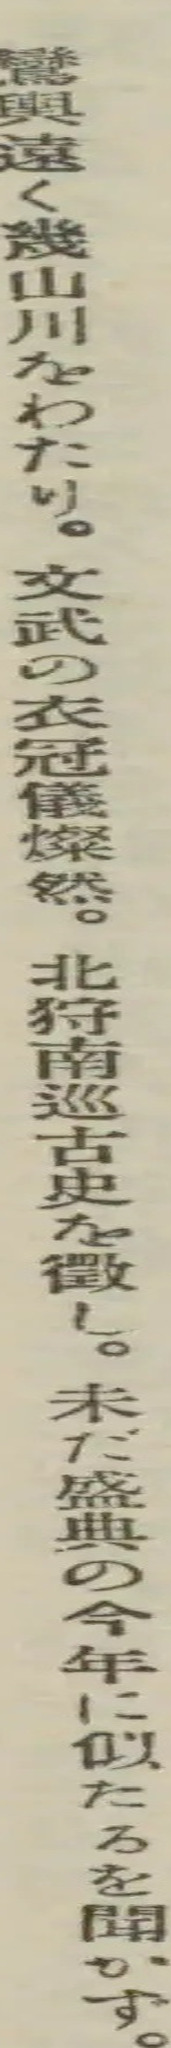鸞輿遠く幾山川をわたり。文武の衣冠儀燦然。北狩南巡古史を徴し。未だ盛典の今年に似たるを聞かず。
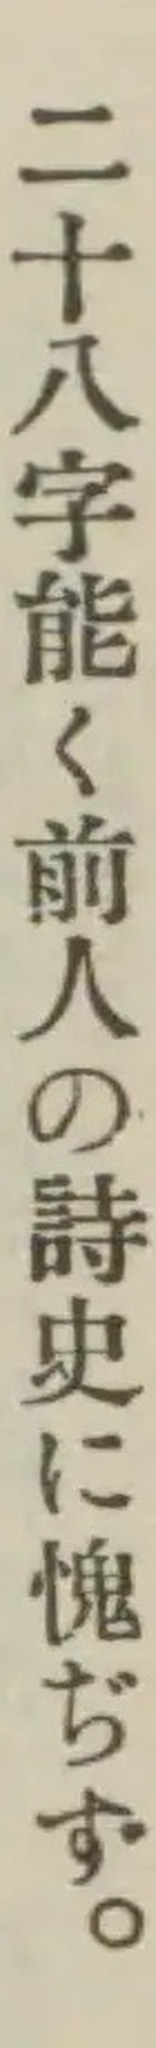二十八字能く前人の詩史に愧ぢず。
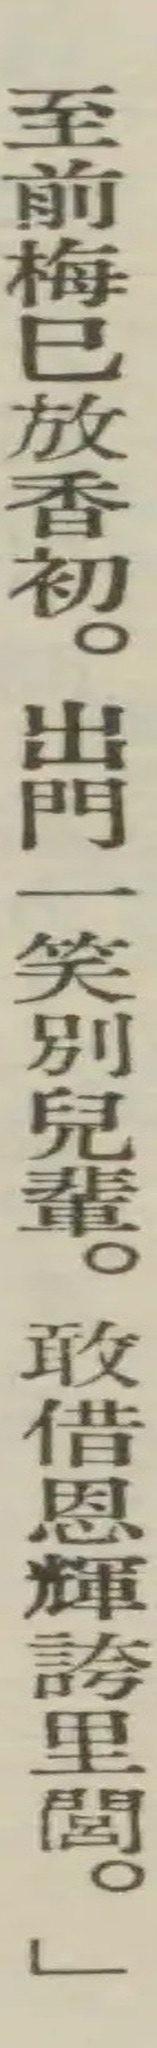至前梅已放香初。出門一笑別兒輩。敢借恩輝誇里閭。」
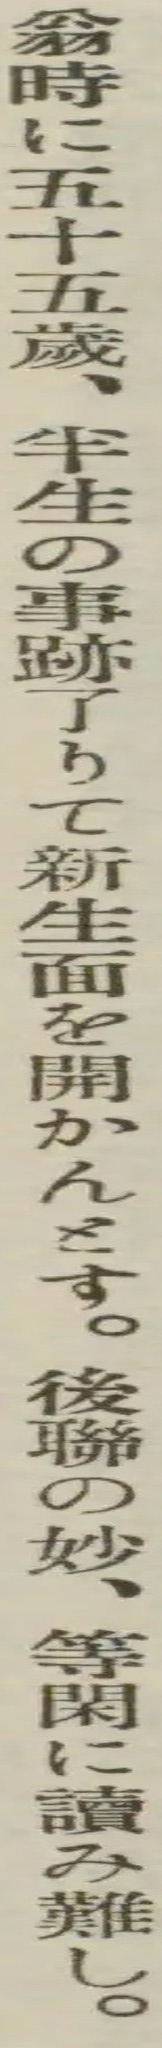翁時に五十五歳、半生の事跡了りて新生面を開かんとす。後聯の妙、等閑に読み難し。
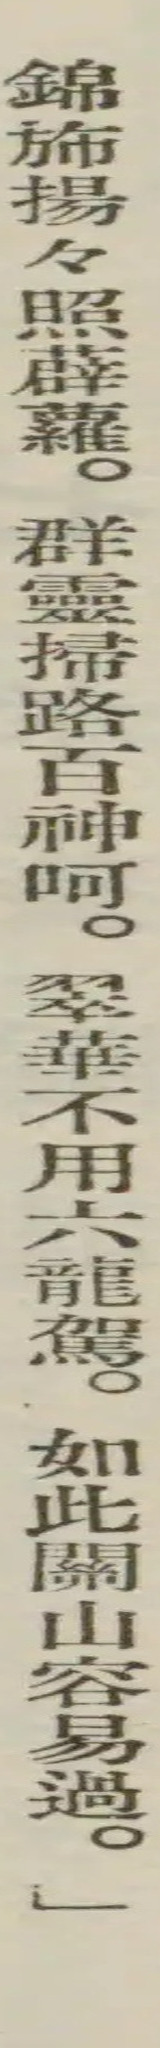錦斾揚々照薜蘿。群靈掃路百神呵。翠華不用六龍駕。如此關山容易過。」
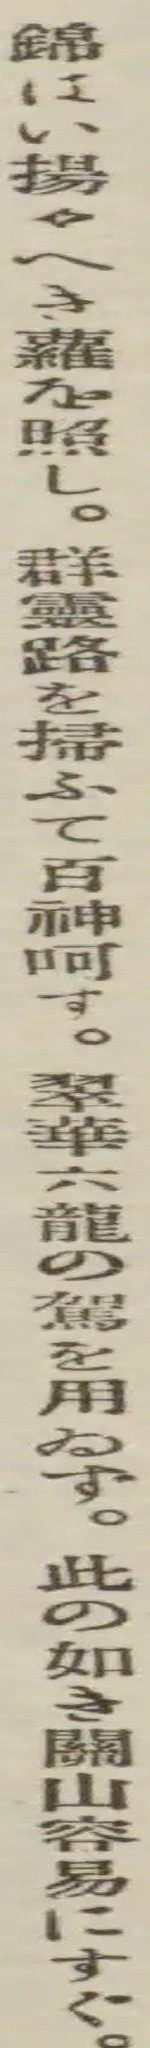錦はい揚々へき蘿を照し。群霊路を掃ふて百神呵す。翠華六龍の駕を用ゐず。此の如き関山容易にすぐ。
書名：小野湖山翁小伝
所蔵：国立国会図書館 National Diet Library, JAPAN
